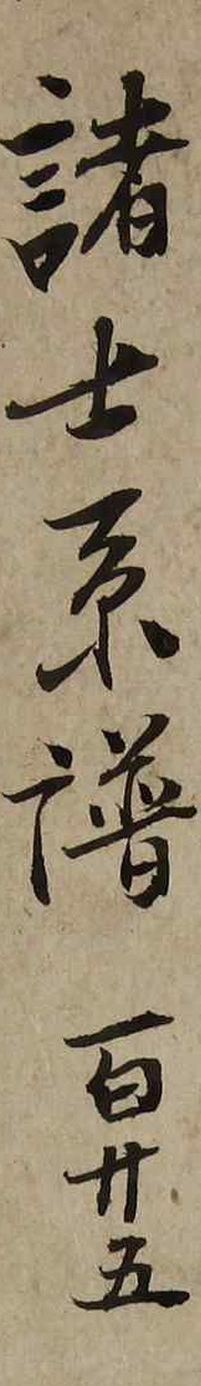諸士系譜百廿五

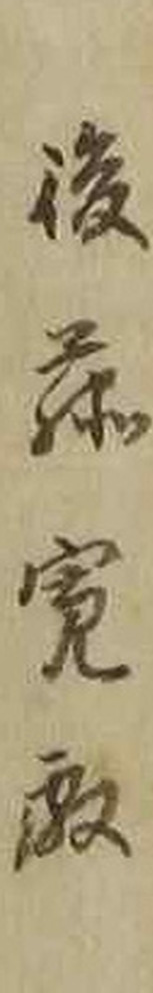後藤寛叡

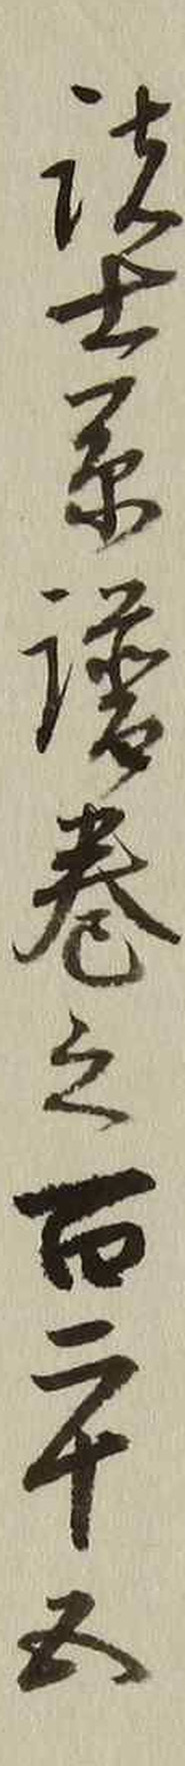諸士系譜巻之百二十五
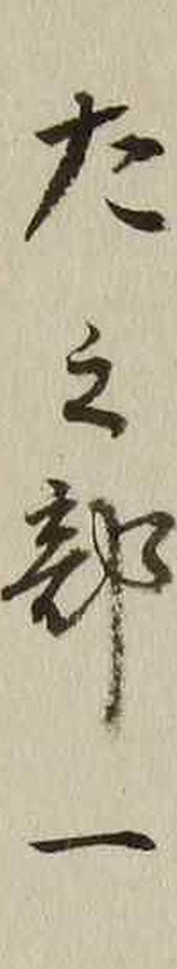た之部一
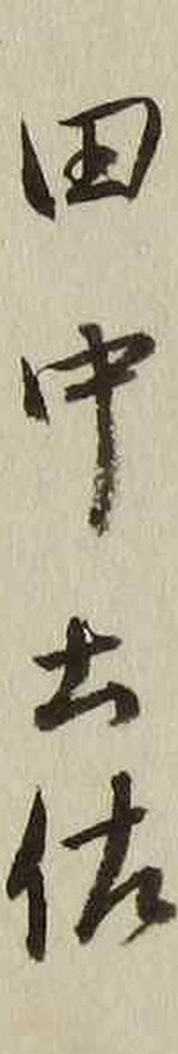田中土佐

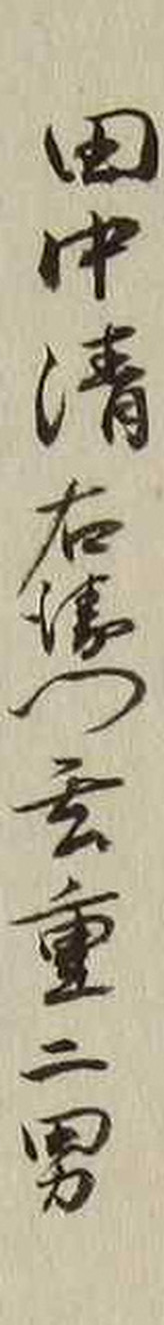田中清右衛門玄重二男
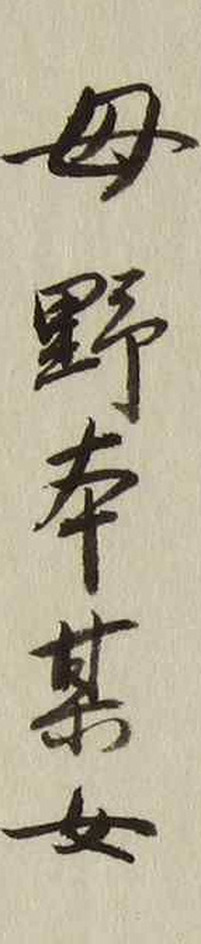母野本某女
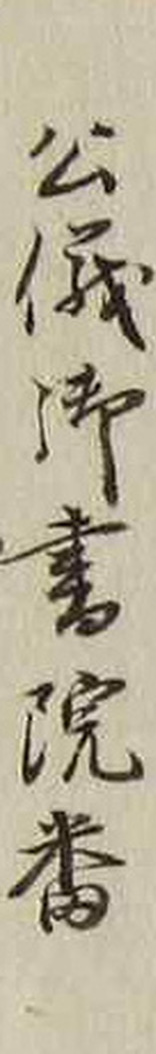公儀御書院番
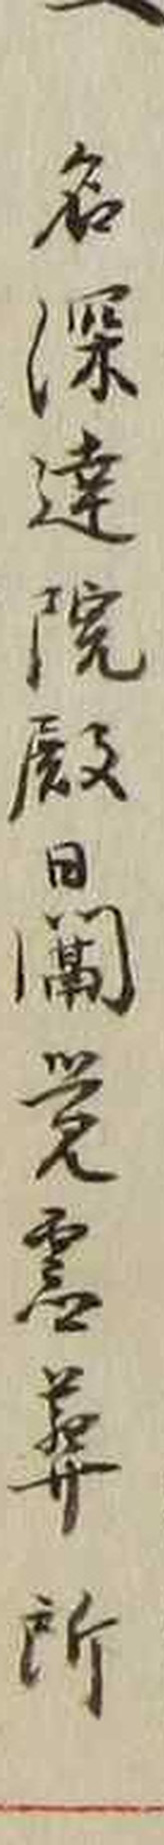名深達院殿日関覚霊葬所
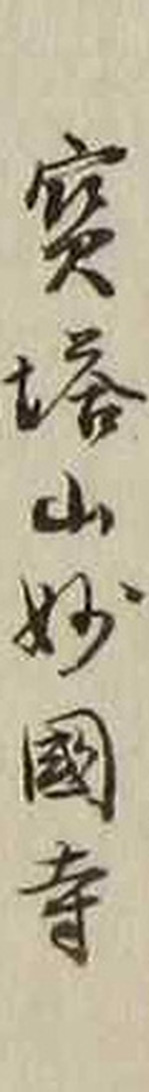宝塔山妙国寺
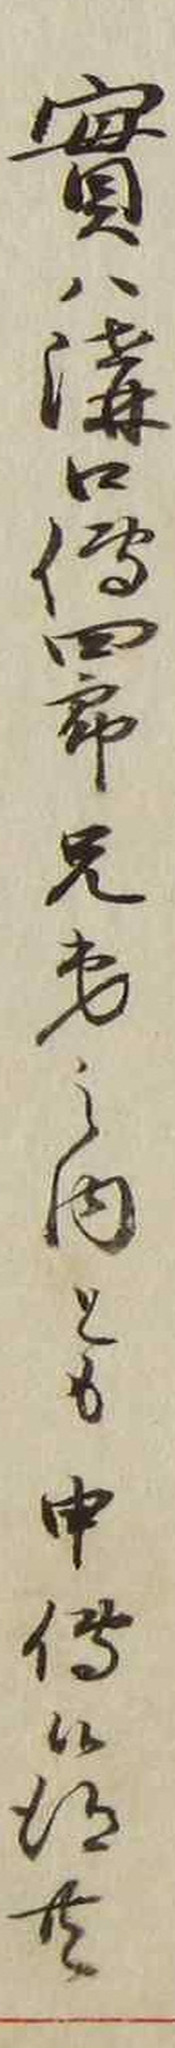実は溝口伝四郎兄弟之内とも申伝候得共

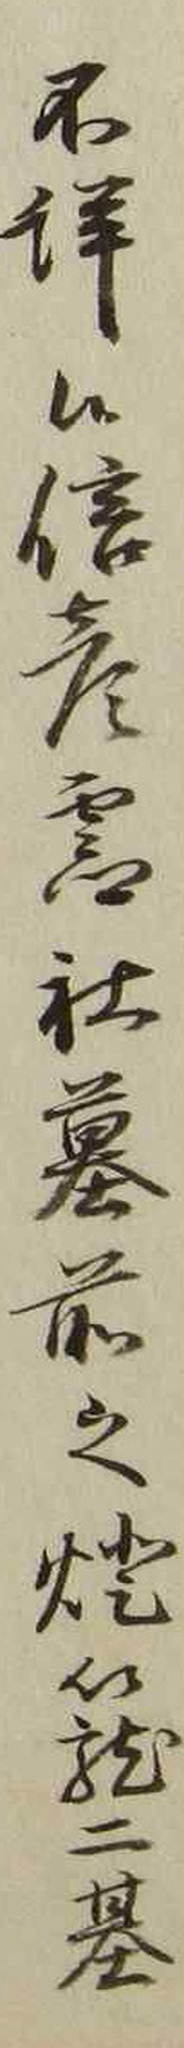不詳候信彦霊社墓前之燈籠二基
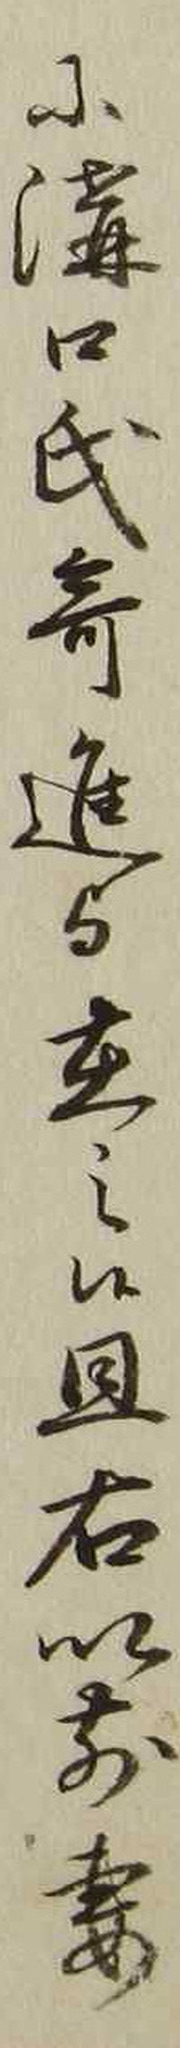に溝口氏寄進と在之候且右以前妻
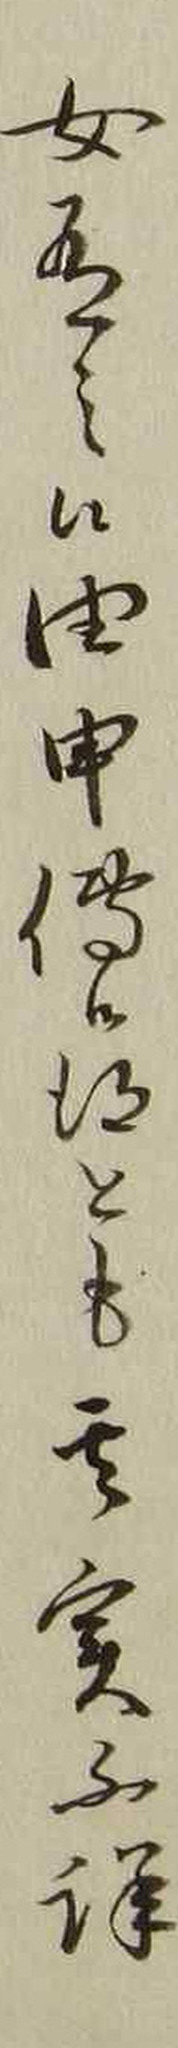女有之候由申伝候得とも其実不詳
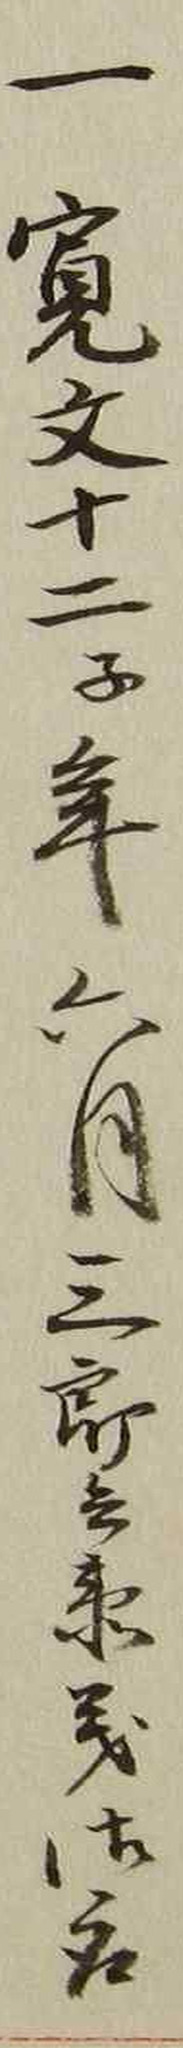一寛文十二子年六月三郎兵衛義御取
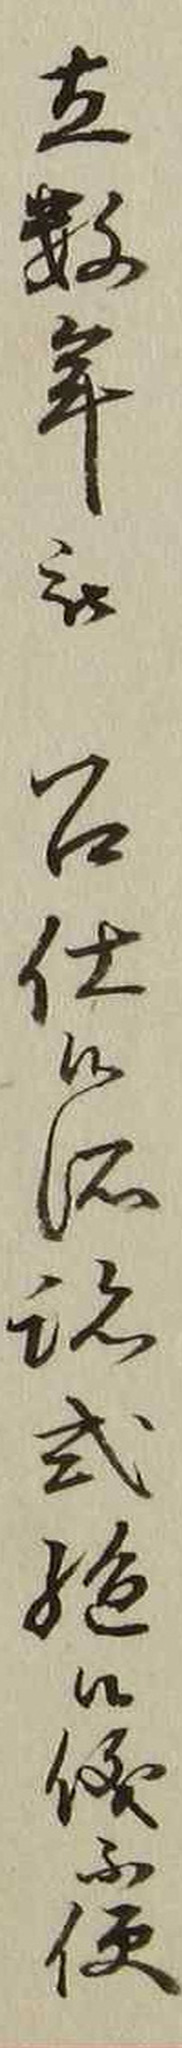立数年被召仕候所跡式絶候儀不便
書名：諸士系譜　巻之125　た之部1
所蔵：会津若松市立会津図書館
